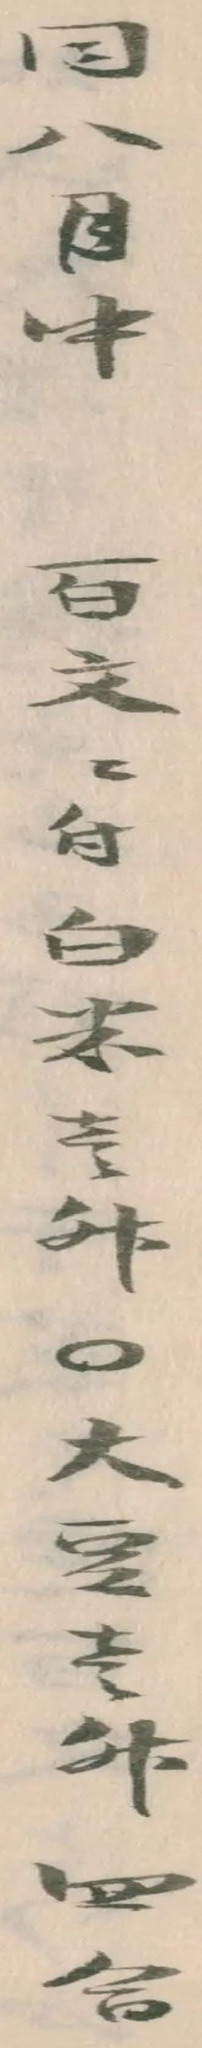同八月中百文ニ付白米壱升〇大豆壱升四合
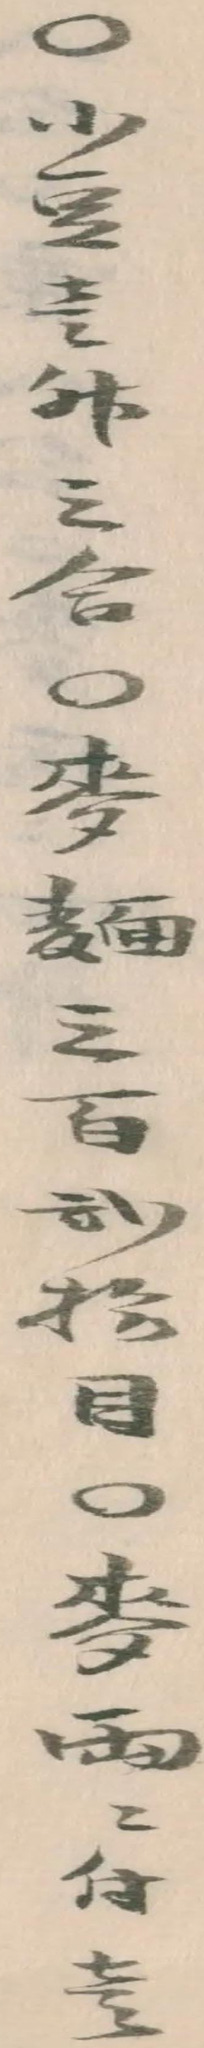〇小豆壱升三合〇麦麺三百弐拾目〇麦両ニ付壱
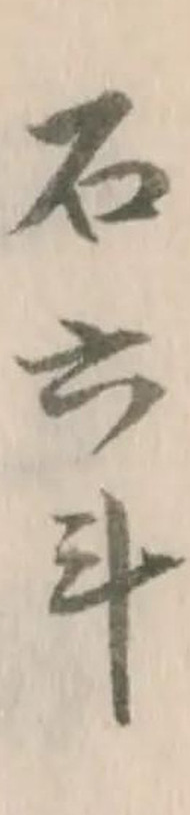石六斗
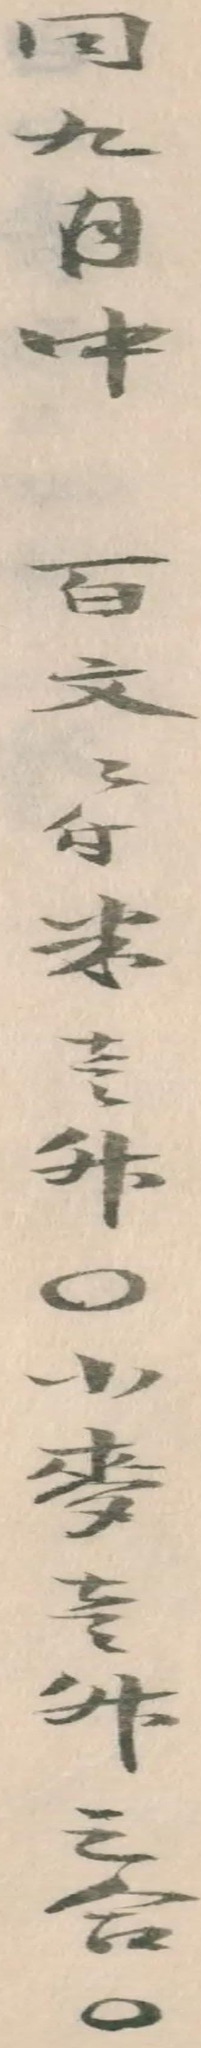同九月中百文ニ付米壱升〇小麦壱升三合〇
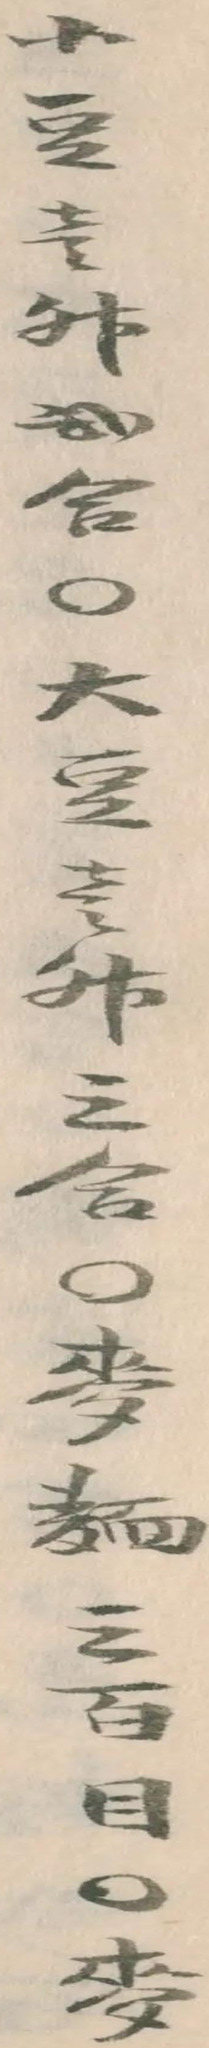小豆壱升弐合〇大豆壱升三合〇麦麺三百目〇麦
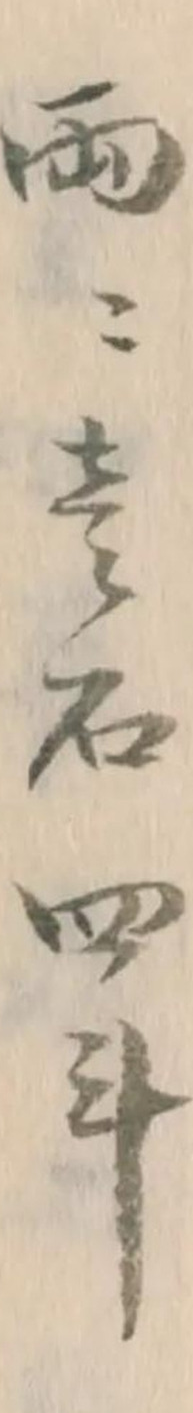両ニ壱石四斗

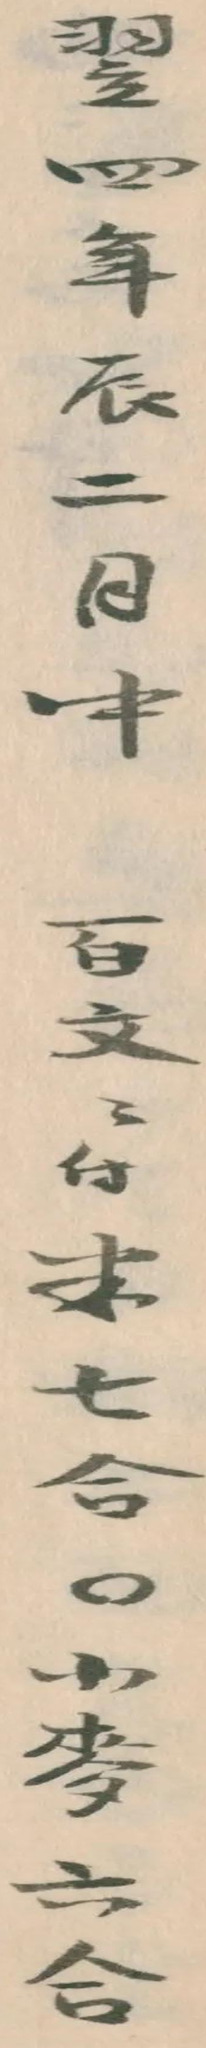翌四年辰二月中百文ニ付米七合〇小麦六合
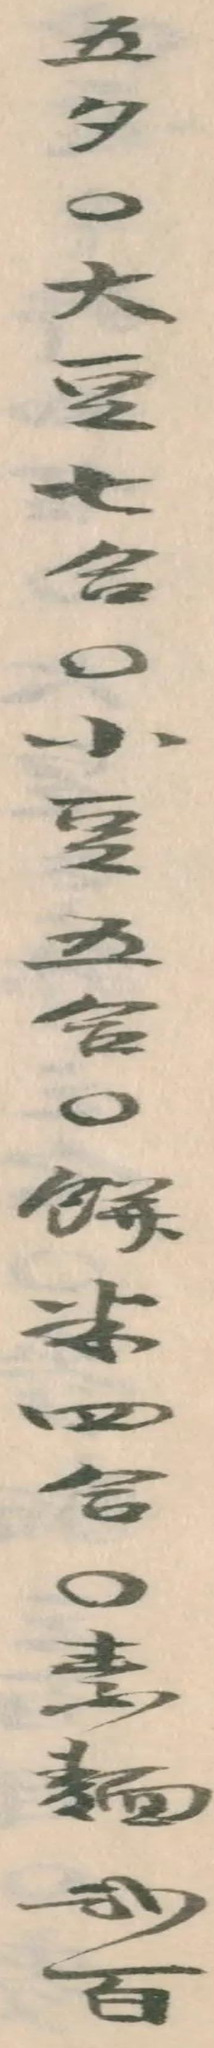五夕〇大豆七合〇小豆五合〇余米四合〇素麺弐百
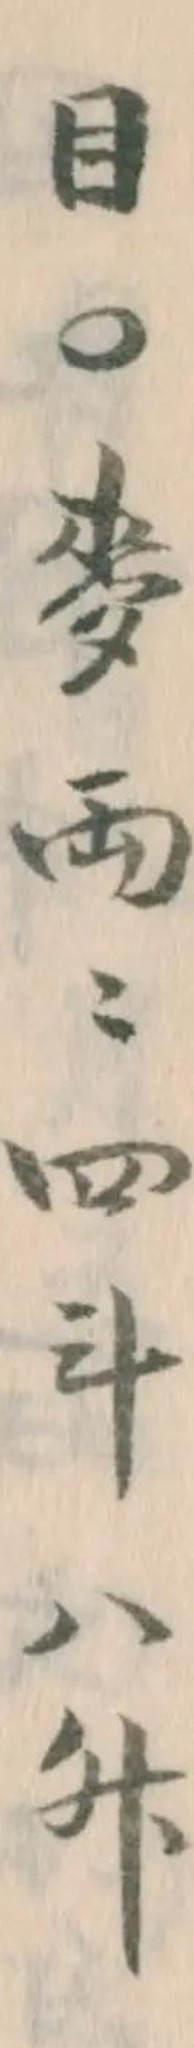目〇麦両ニ四斗八升
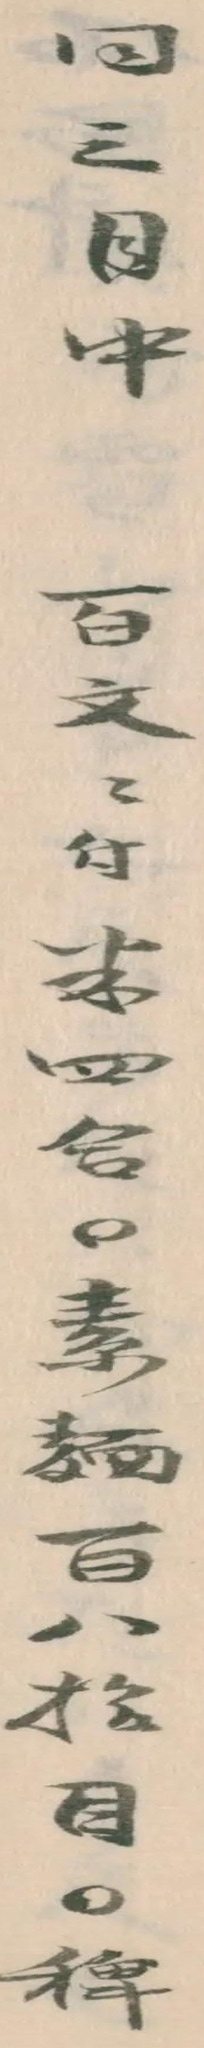同三月中百文ニ付米四合〇素麺百八拾目〇稗
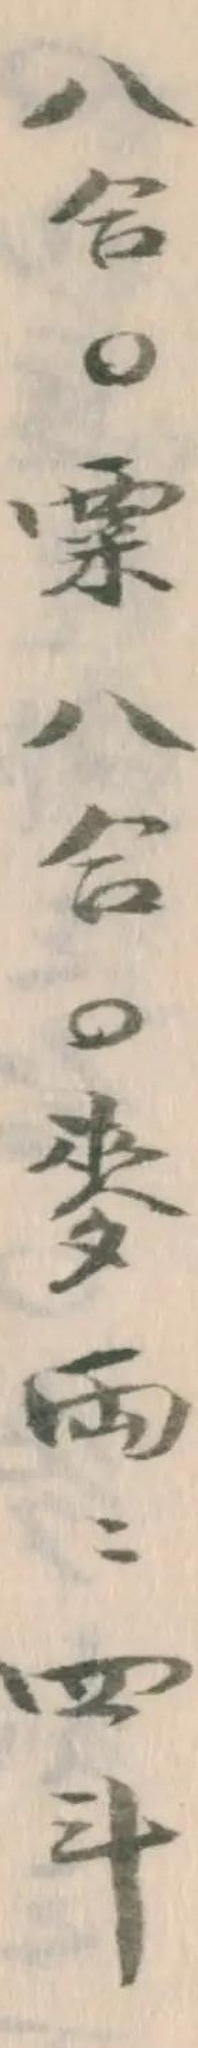八合〇粟八合〇麦両ニ四斗
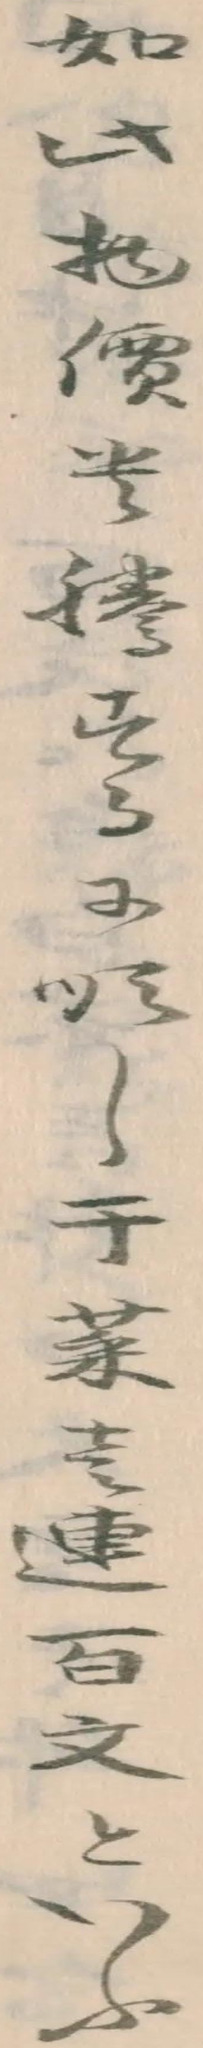如此物価貴騰するに順し于菜壱連百文といふ
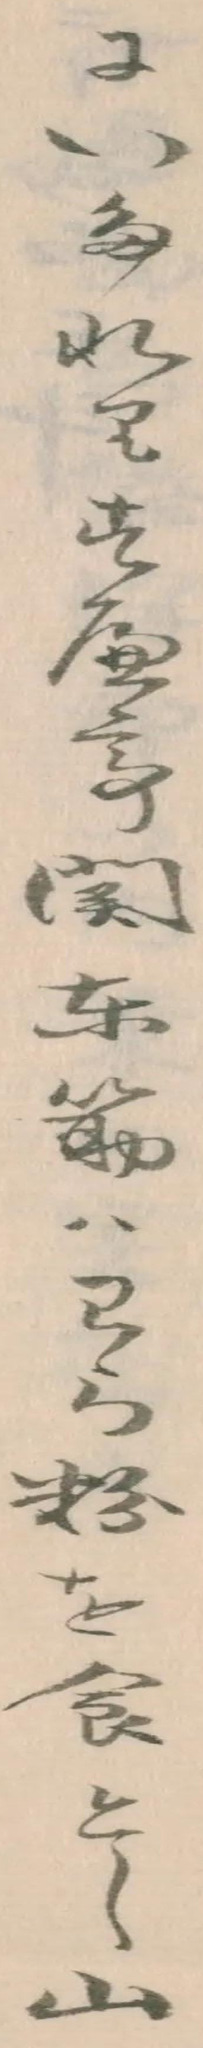にいたれりすへて関東筋はわら粉を食とし山
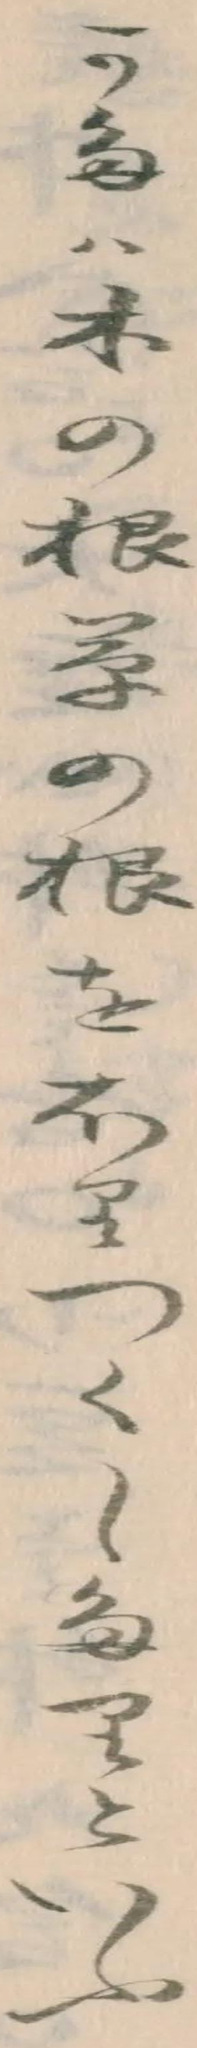かたは木の根草の根をほりつくしたりといふ
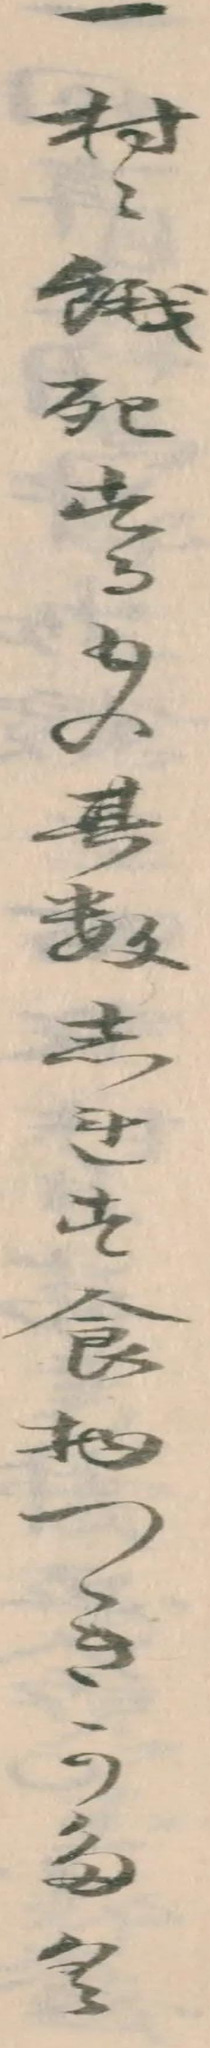一村々餓死するもの其数しれす食物つゝきかたく
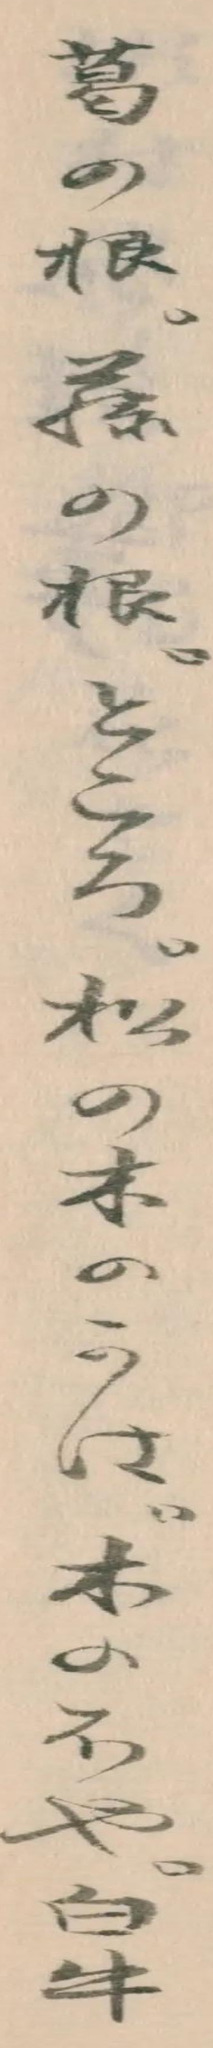葛の根。藤の根。ところ。松の木のかは。木のほや。白牛
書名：地災撮要. 巻11-12(地震之部)
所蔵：国立国会図書館 National Diet Library, JAPAN
